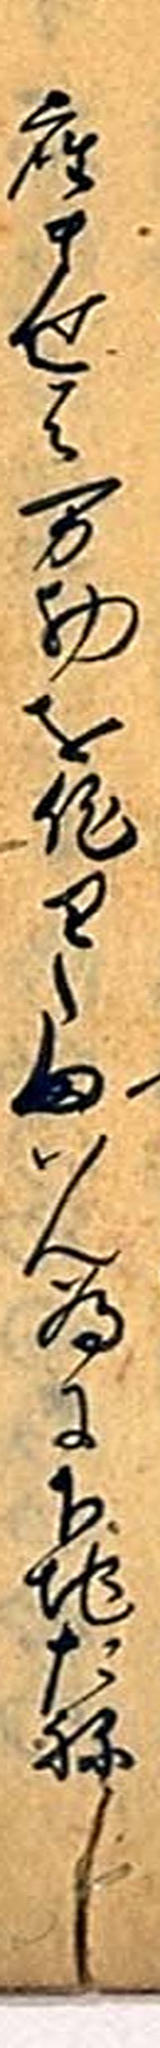座ませは万物を作りたまはん為に下地たね
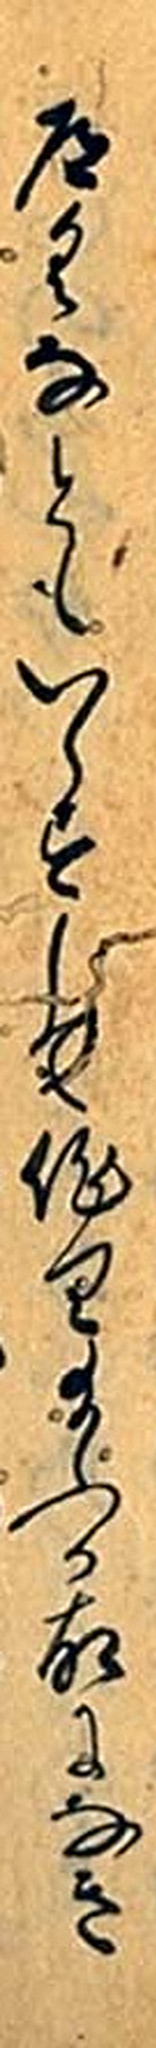道具なともいらすして作り給ふか故になき
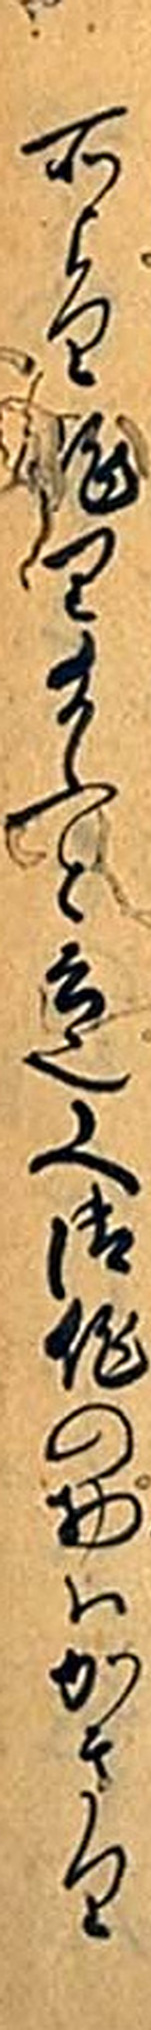所より作り給ふと云也又御作の物はかきり

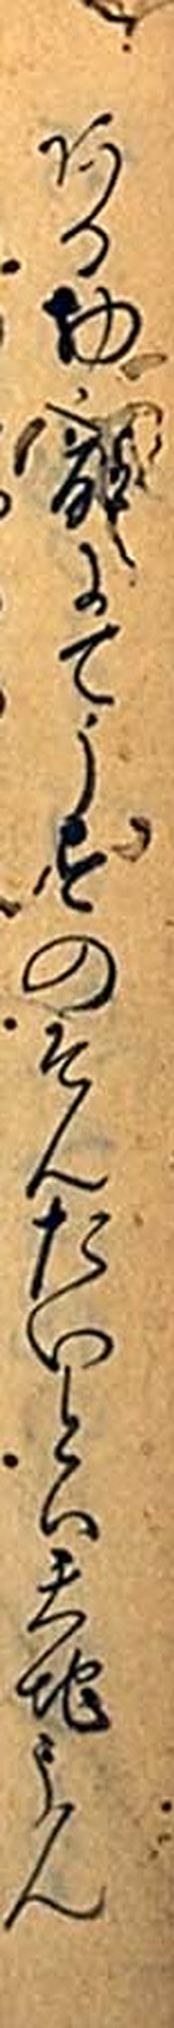ある物也故にてうすのそんたいとは天地うん
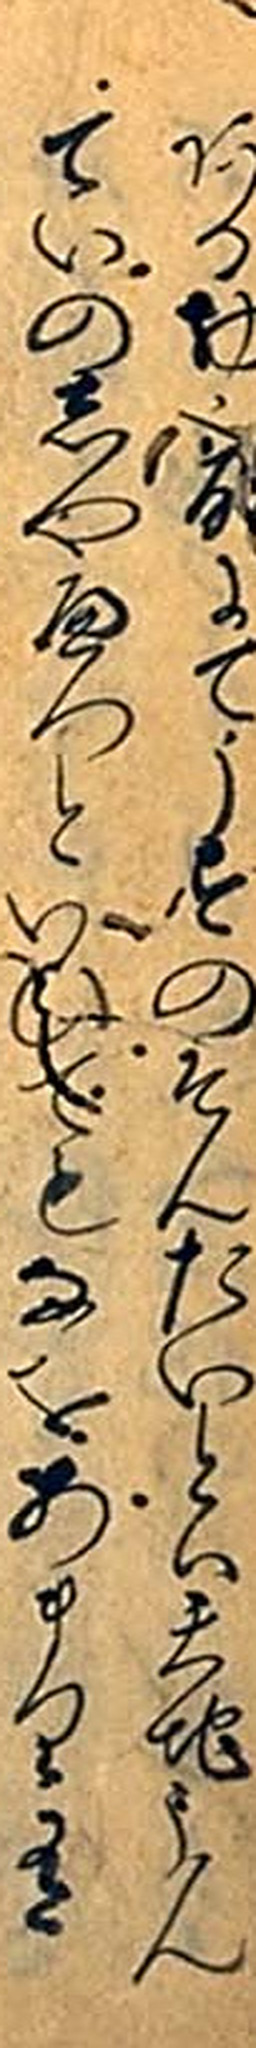ていのしやへつといひてもなをあまり有
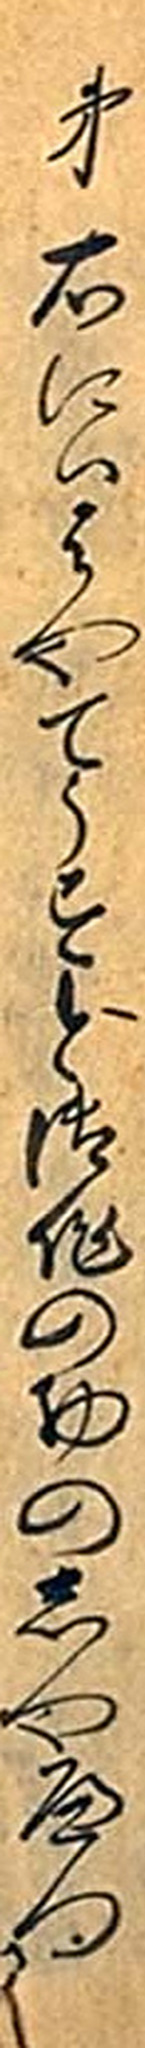弟右にははやてうすと御作の物のしやへつ
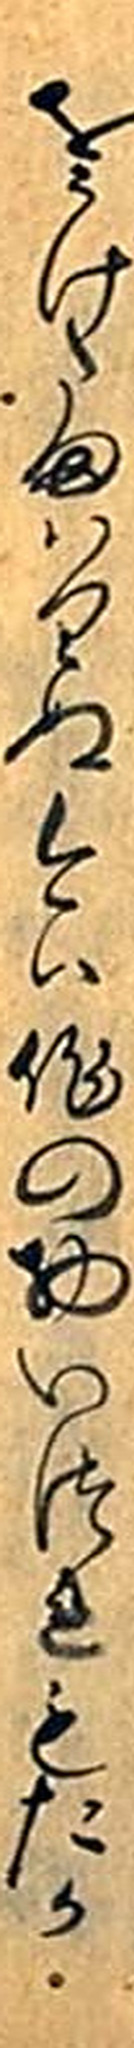をうけたまはりぬ今は作の物いつれもたか
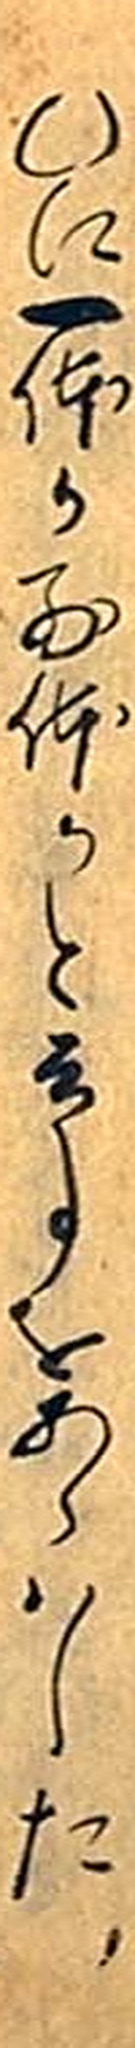ひに一体か別体かと云事をあらはした
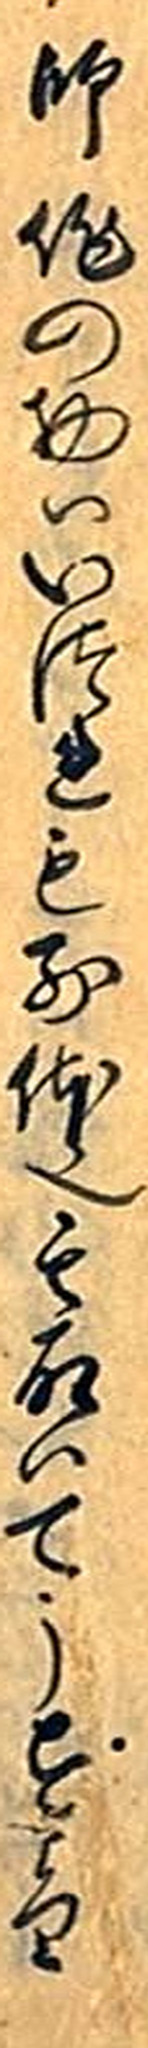師作の物はいつれも別体也其故はてうすより
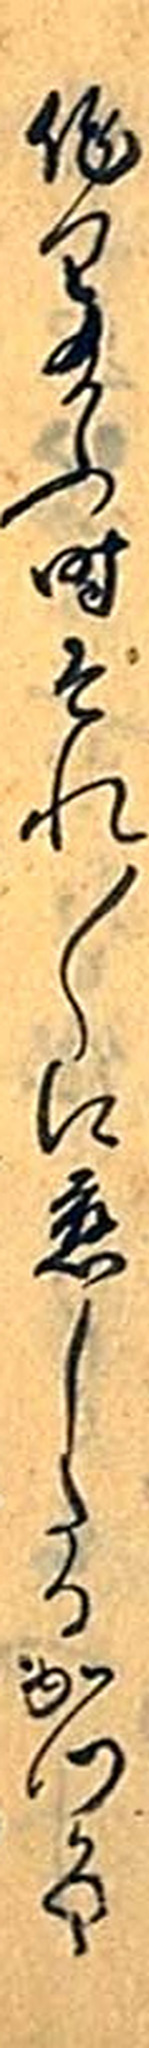作り給ふ時それ〳〵に応したるかつかく
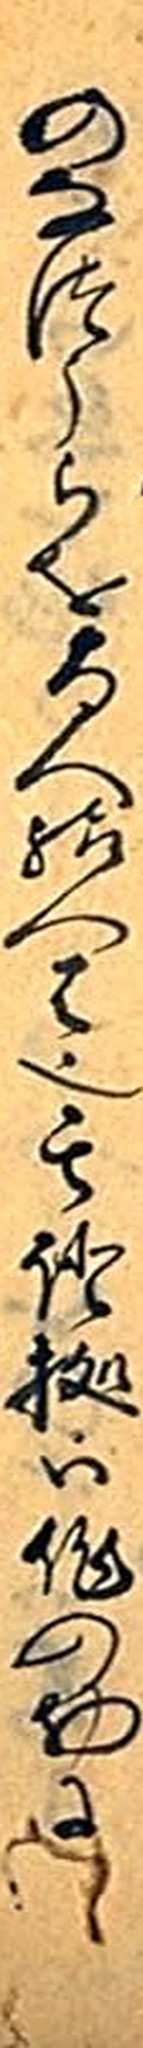のなつうらを与へ給へは也其証拠は作の物に
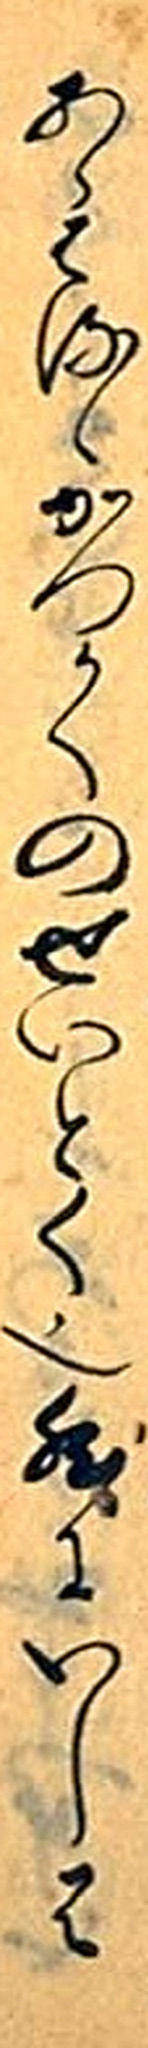あらはるゝかつかくのせいとく也然にいしは
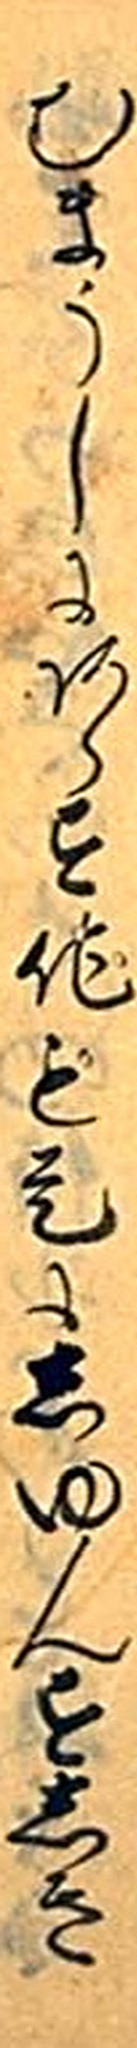むまうしにあらす他も是にしゆんすしき
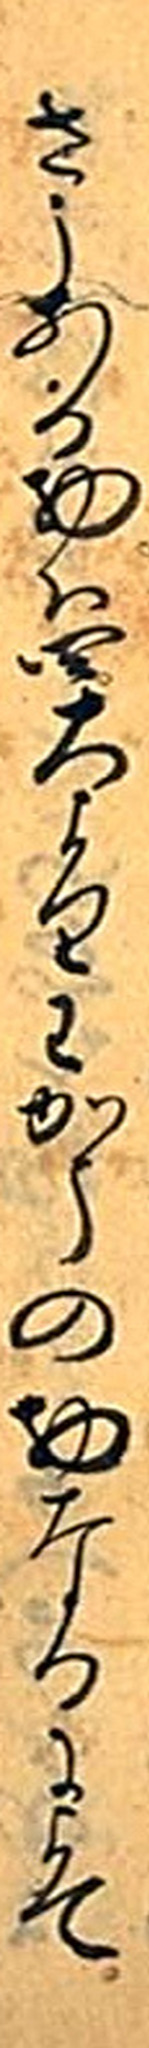さうある物は四大よりわかうの物なるによて
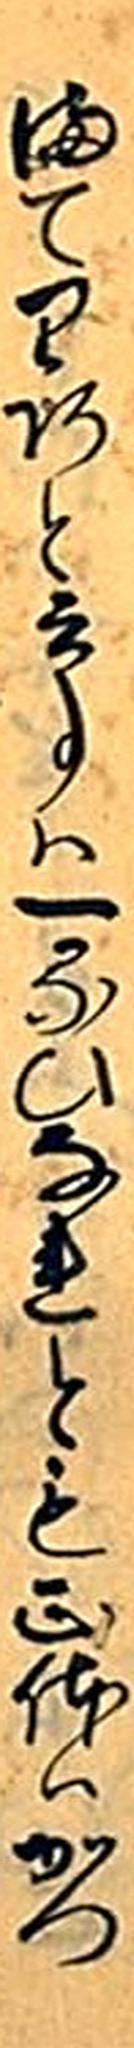まてりあと云事は一るひなれとも正体はかつ
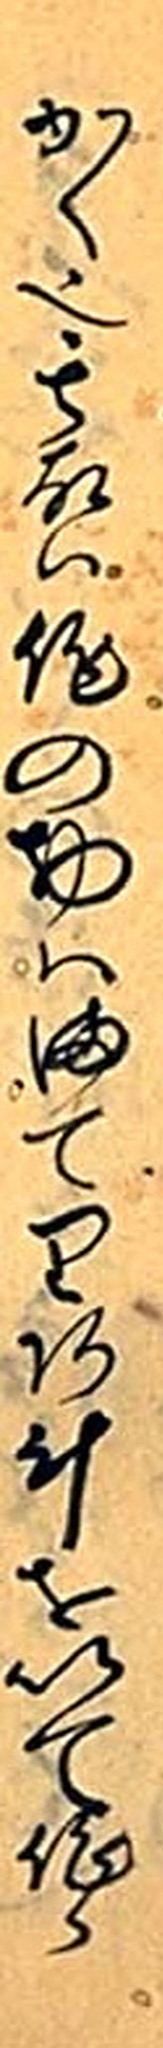かく也其故は作の物はまてりあ計を以て作ら
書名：ドチリナ・キリシタン
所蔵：東京大学総合図書館 / General Library in the University of Tokyo
